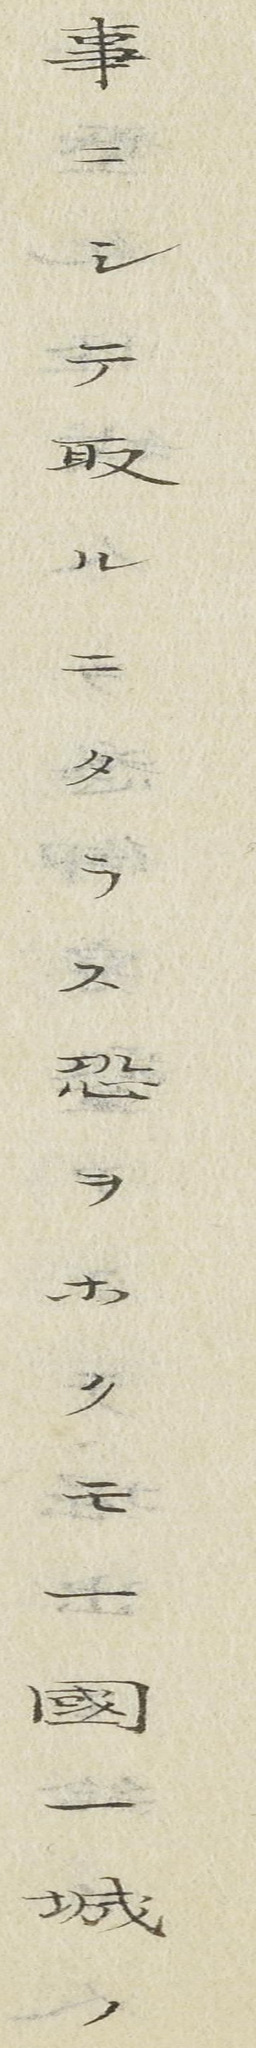事ニシテ取ルニタラス恐ヲホクモ一国一城ノ
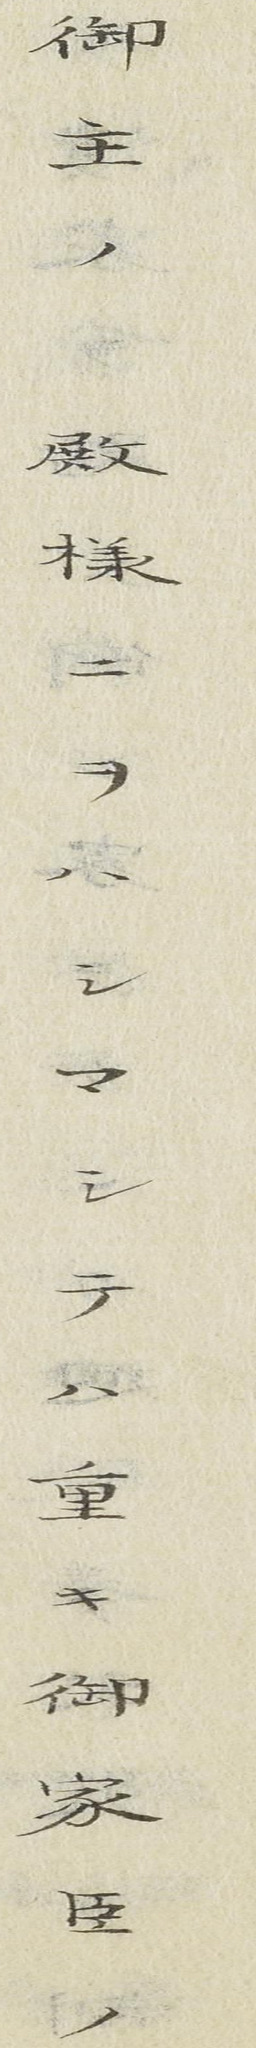御主ノ殿様ニヲハシマシテハ重キ御家臣ノ
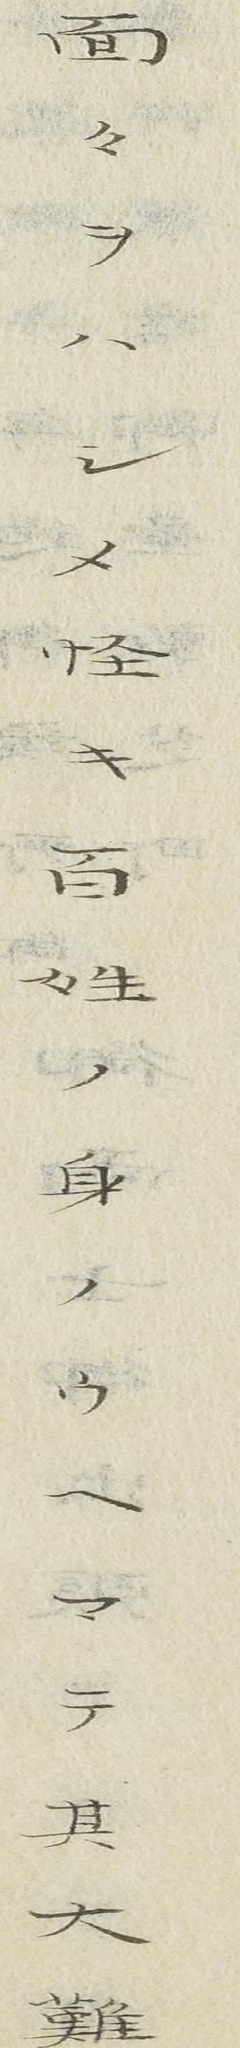面々ヲハシメ怪キ百姓ノ身ノウヘマテ其大難
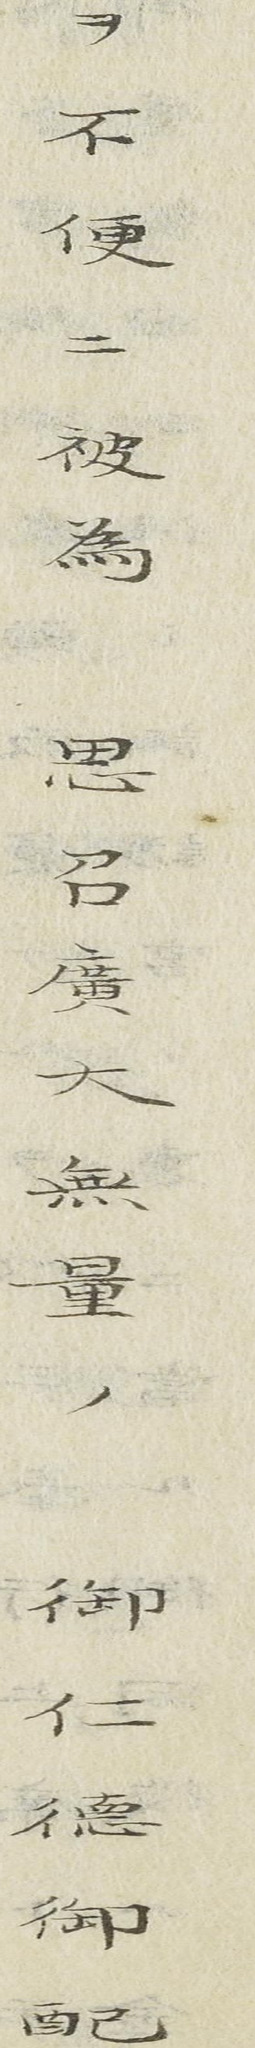ヲ不便ニ被為思召広大無量ノ御仁徳御配
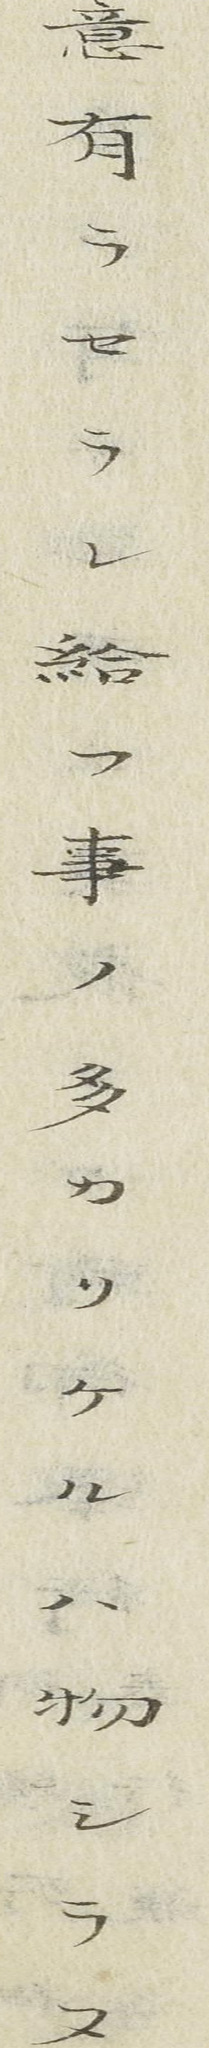意有ラセラン給フ事ノ多カリケルハ物シラヌ
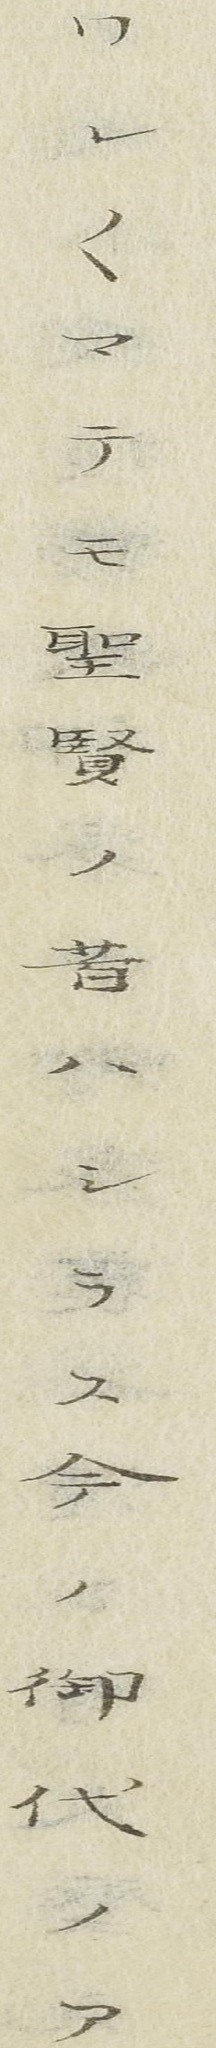ワレ〱マテモ聖賢ノ者ハシラス今ノ御代ノア
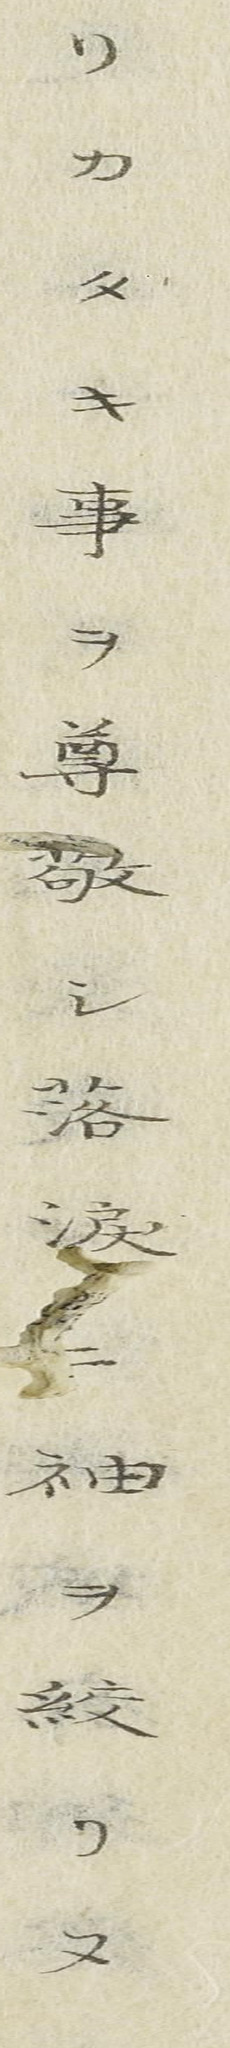リカタキ事ヲ尊敬シ落涙ニ袖ヲ絞リヌ

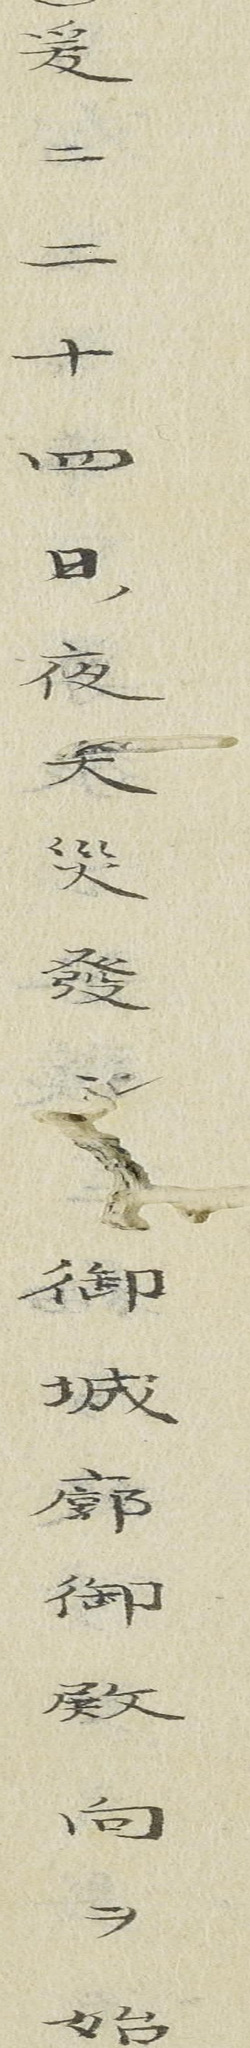〇爰ニ二十四日ノ夜大災発シ御城郭御殿向ヲ始
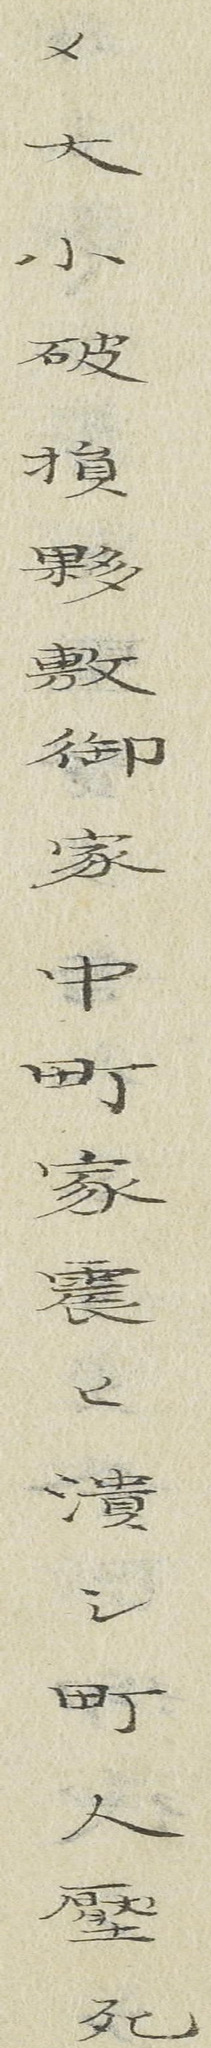メ大小破損夥敷御家中町家震ヒ潰シ町人圧死
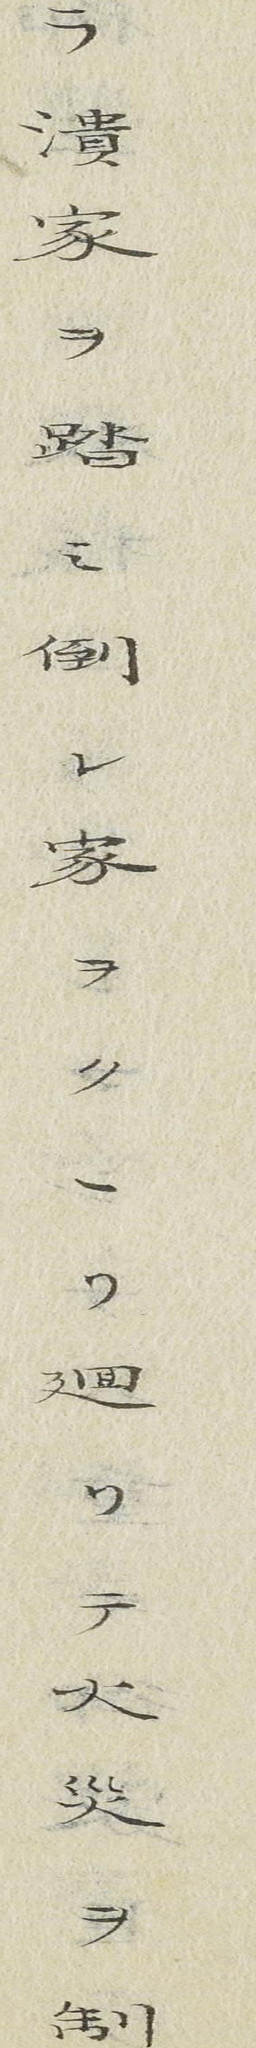ラ潰家ヲ踏ミ倒レ家ヲクヽリ廻リテ火災ヲ制
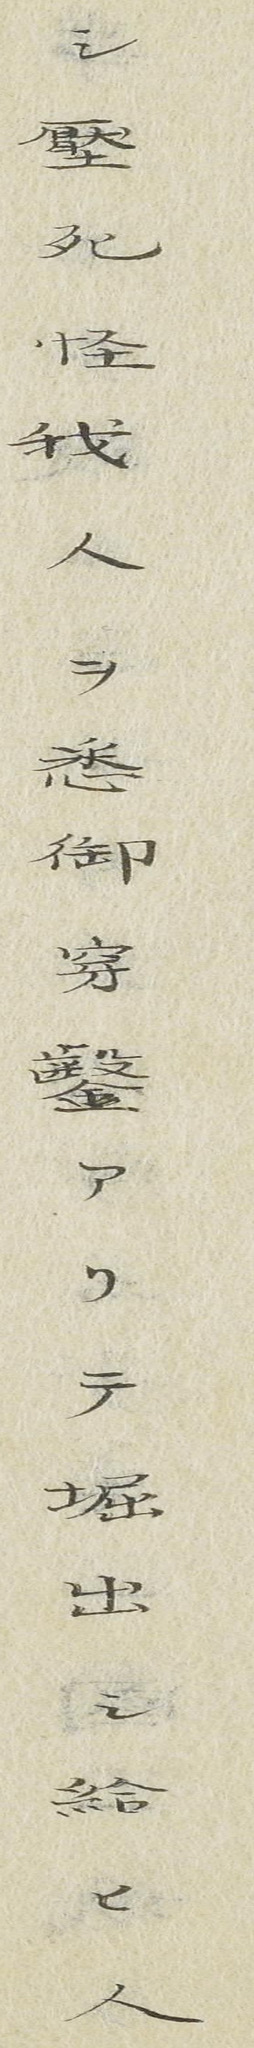シ圧死怪我人ヲ悉御穿鑿アリテ掘出シ給ヒ人
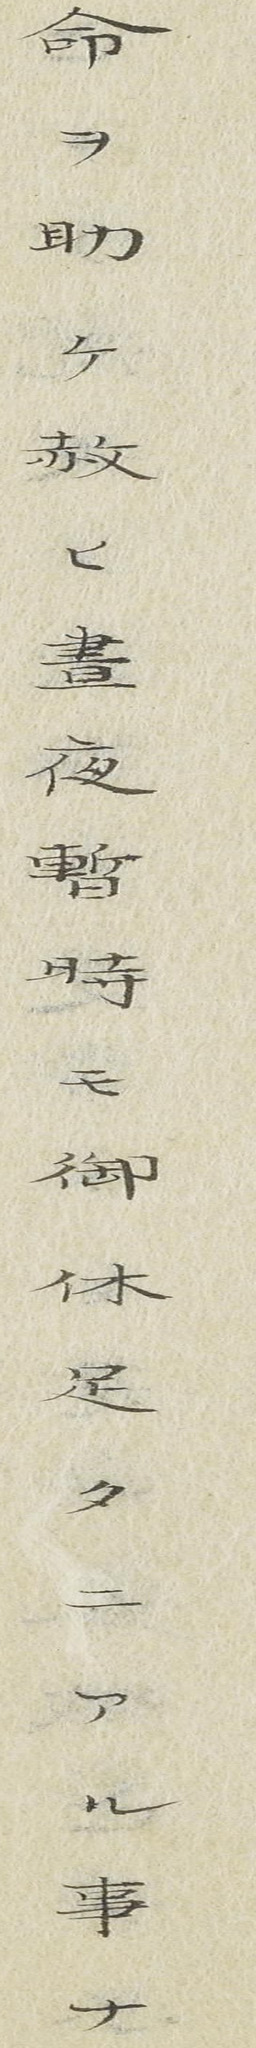命ヲ助ケ赦ヒ昼夜暫時モ御休足タニアル事ナ
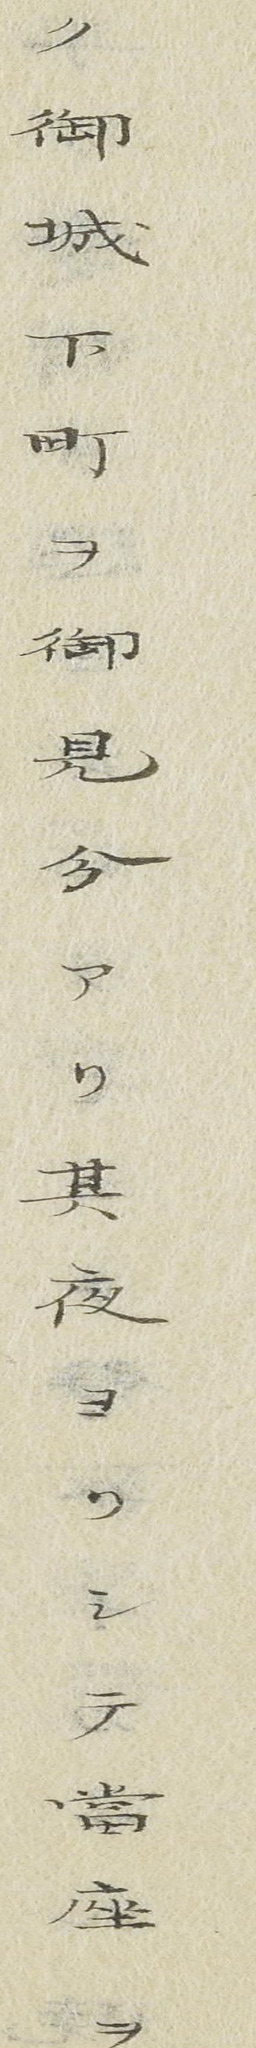ク御城下町ヲ御見分アリ其夜ヨリシテ当座ヲ
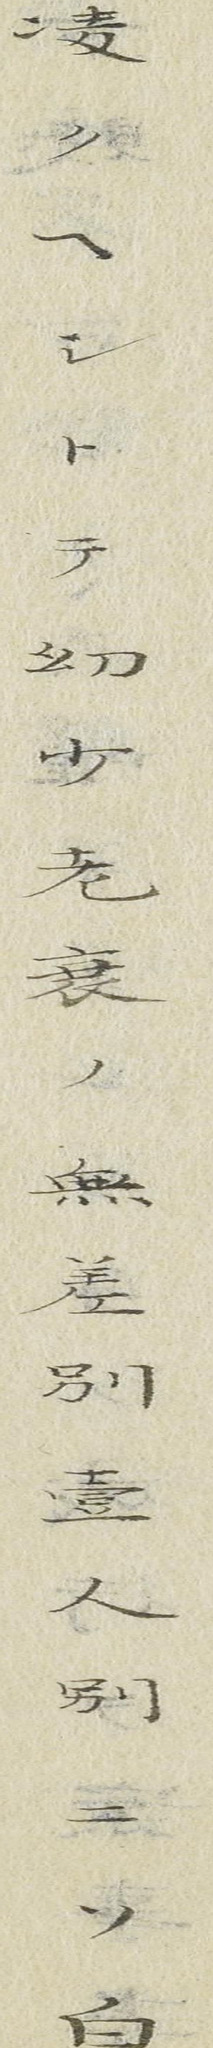凌クヘシトテ幼少老衰ノ無差別一人別ニソ白
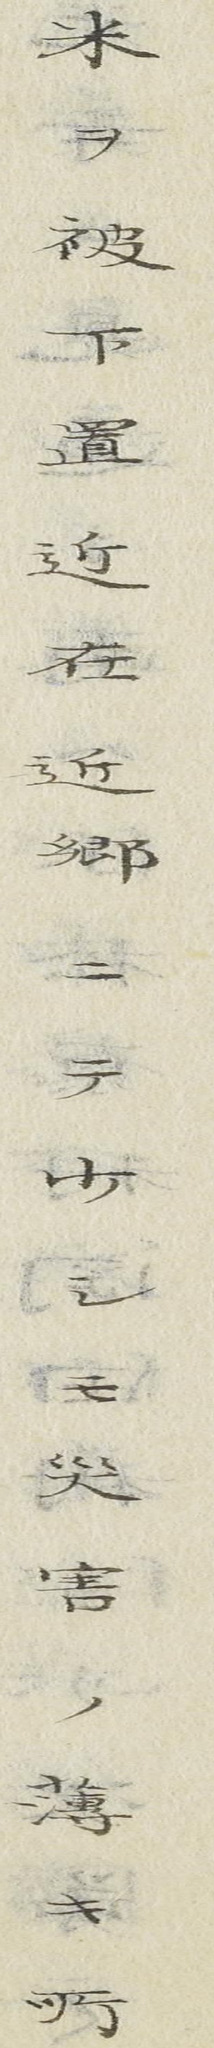米ヲ被下置近在近郷ニテ少シモ災害ノ薄キ所
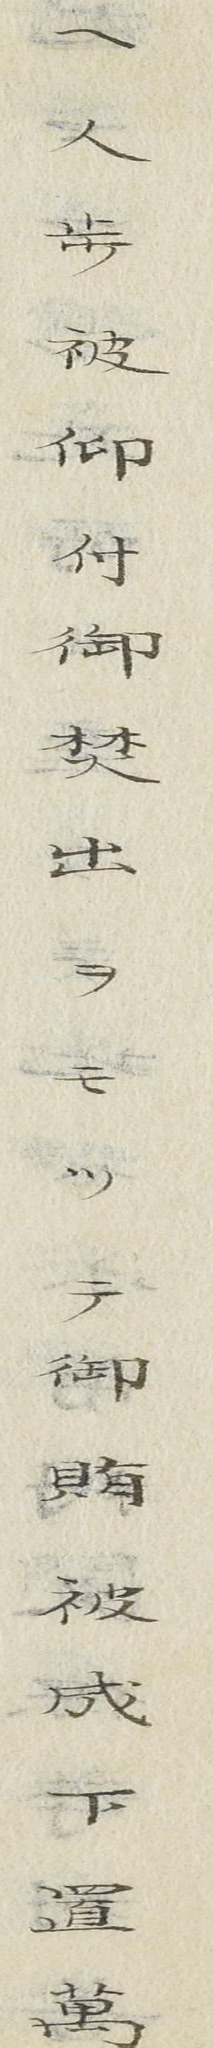ヘ人歩被仰付御焚出ヲモツテ御賄被成下置万
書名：地災撮要　地震之部　巻ノ二
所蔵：東京大学地震研究所図書室 Earthquake Research Institute Library, The University of Tokyo, JAPAN
